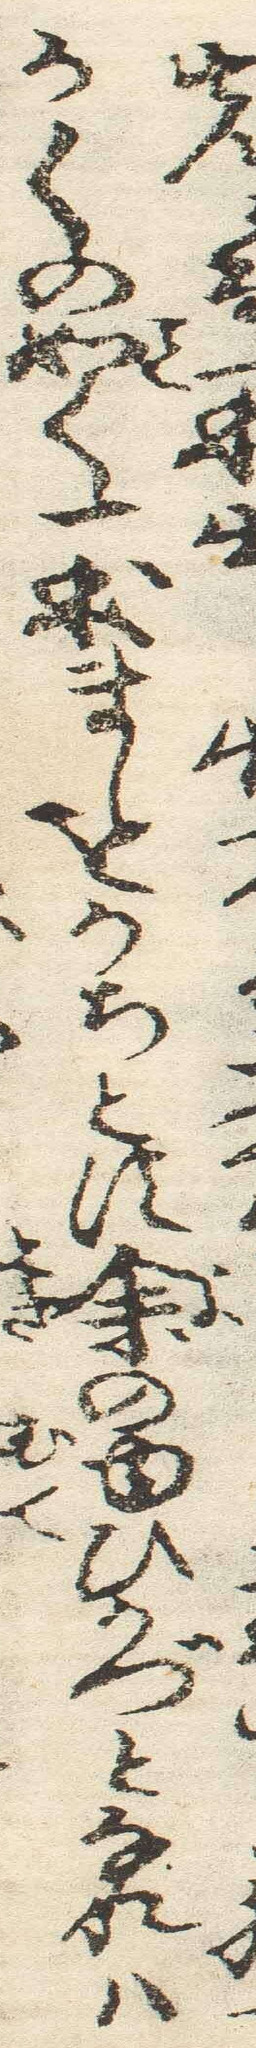かくの如く一本ましをかちとす余のゆひかづとなれは
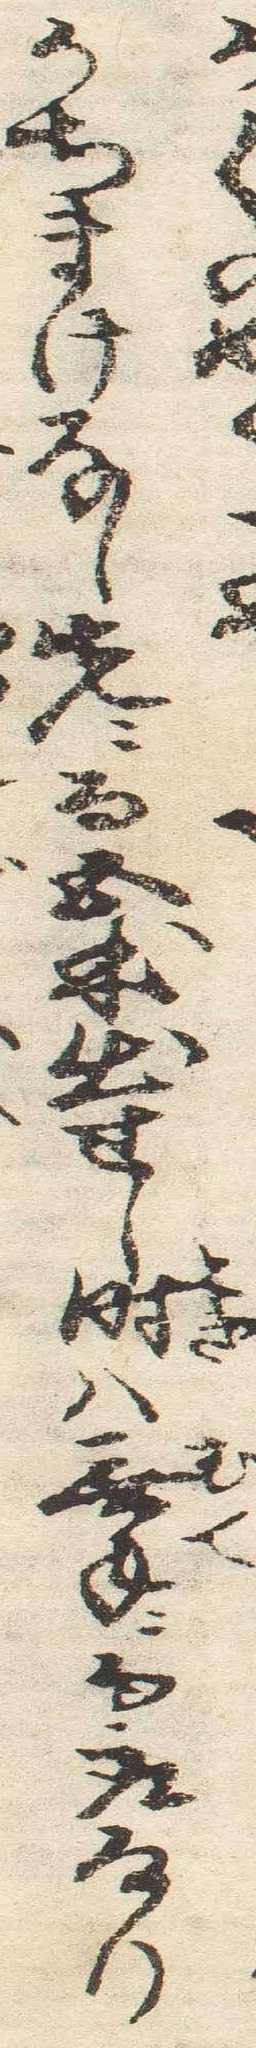かちまけなし先にて五本出せし時は無手にて取なり
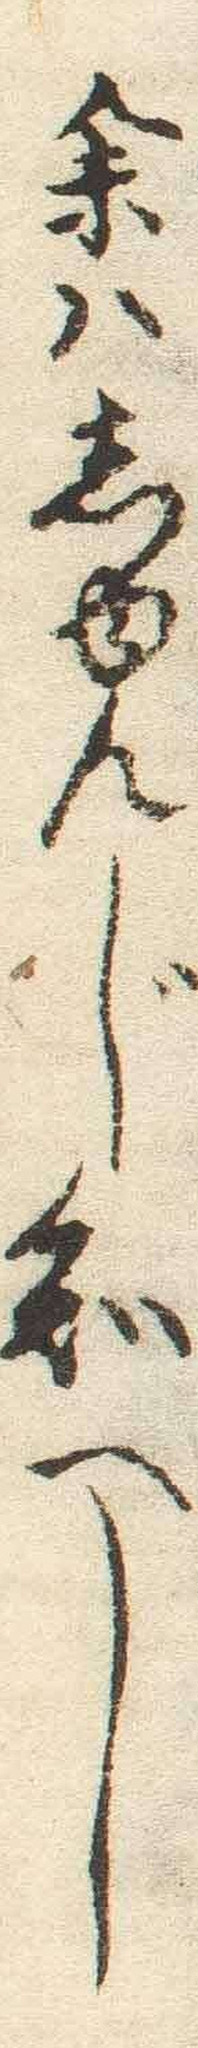余はしゆんじ知へし

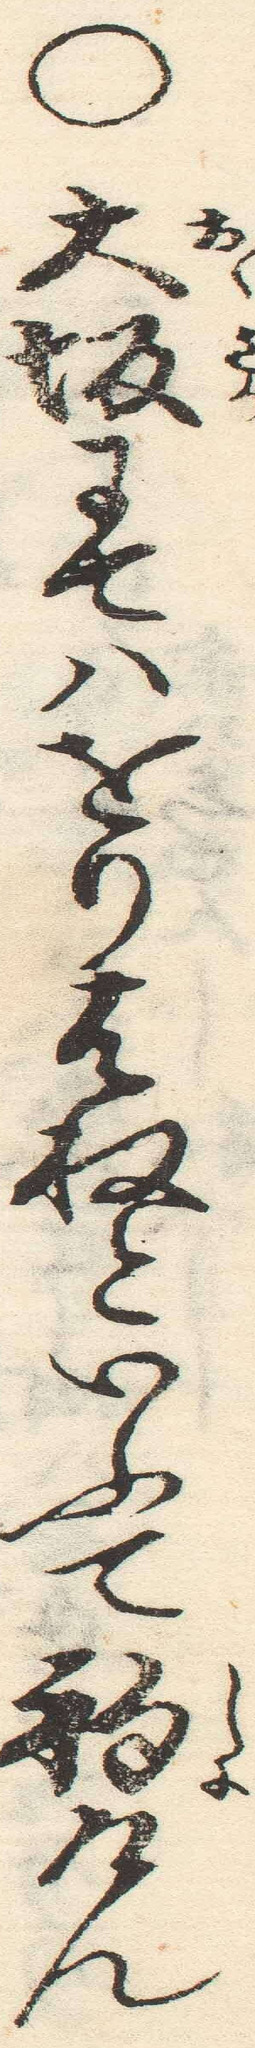○大坂にてはをりはねといふて初けん
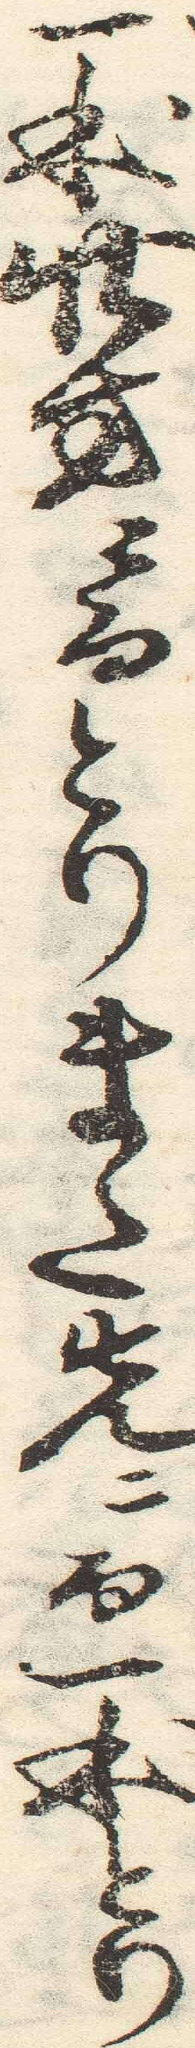一本此方にてとりまた先にて一本とり
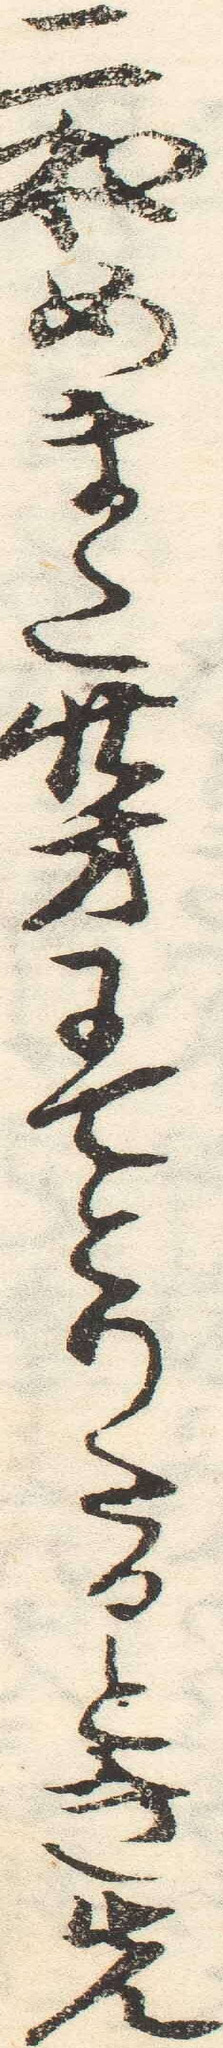二本めまた此方にてとりたるとき先
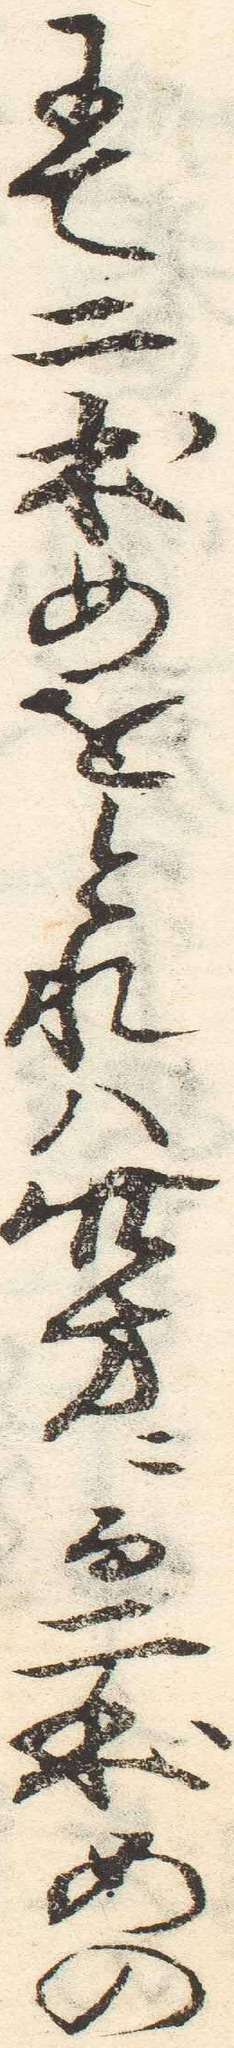にて二本めをとれは此方にて二本めの
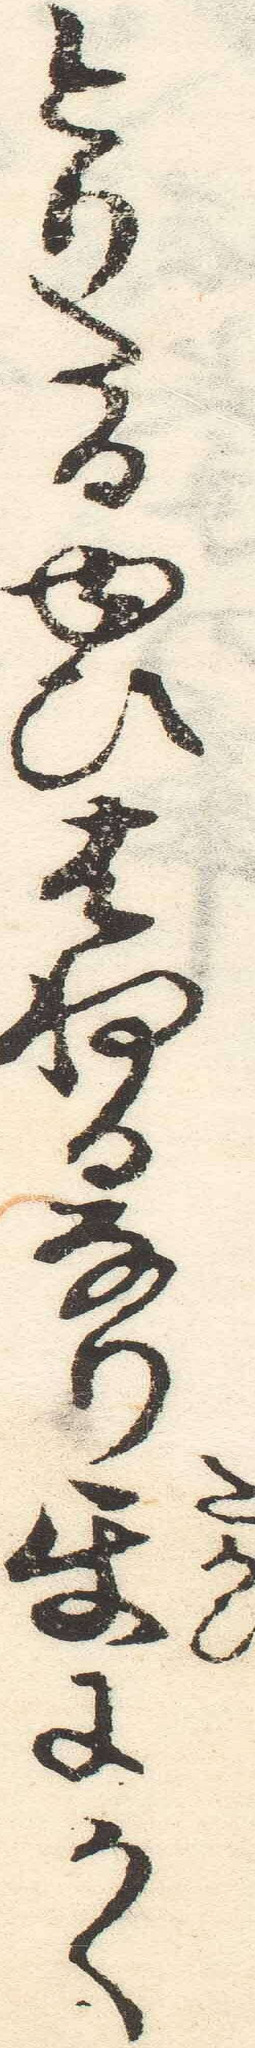とりたるゆひはねるなり互にかく
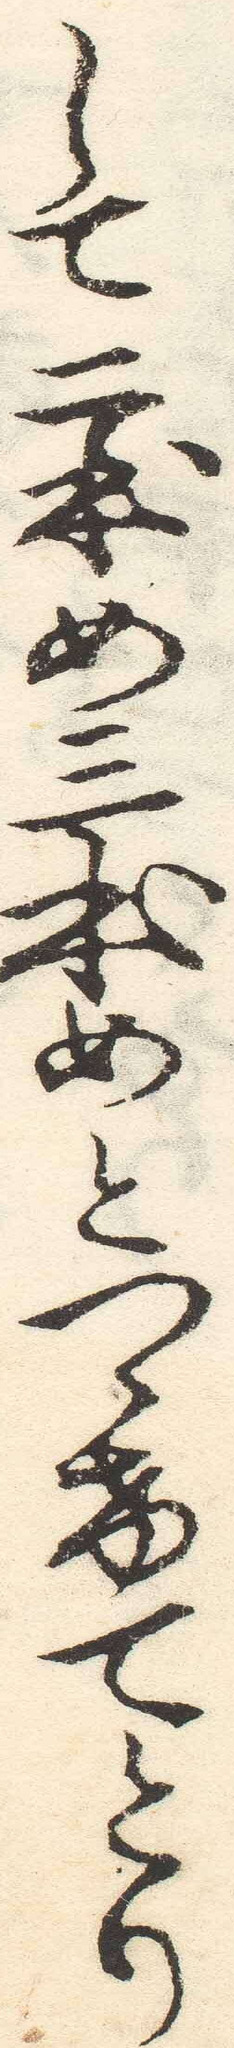して二本め三本めとつゝけてとり
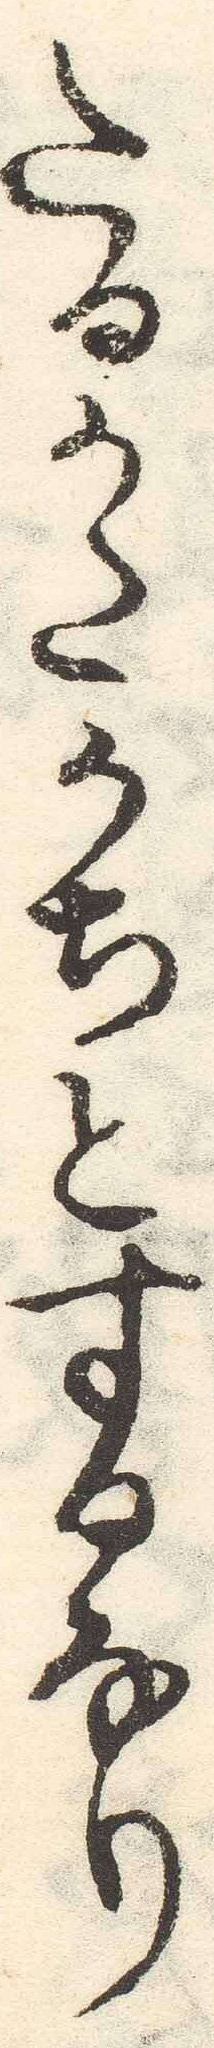たるかたかちとするなり
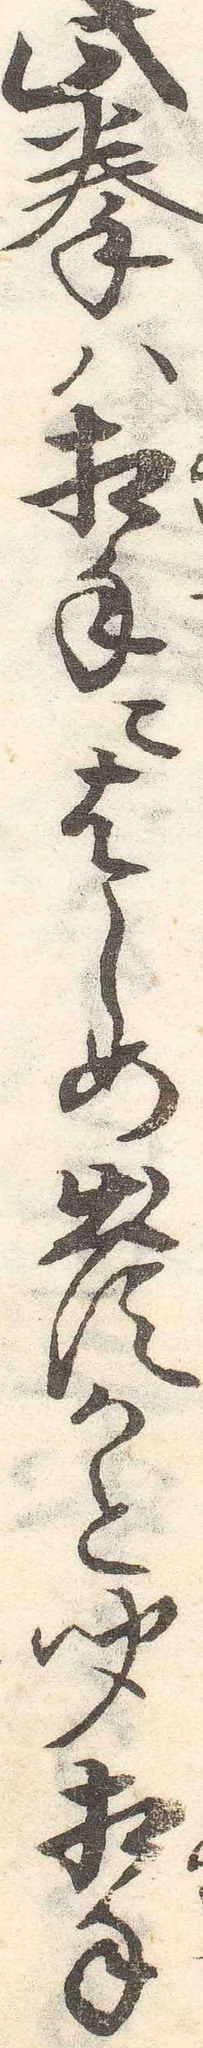此拳は相手にはしめ出すかと聞相手
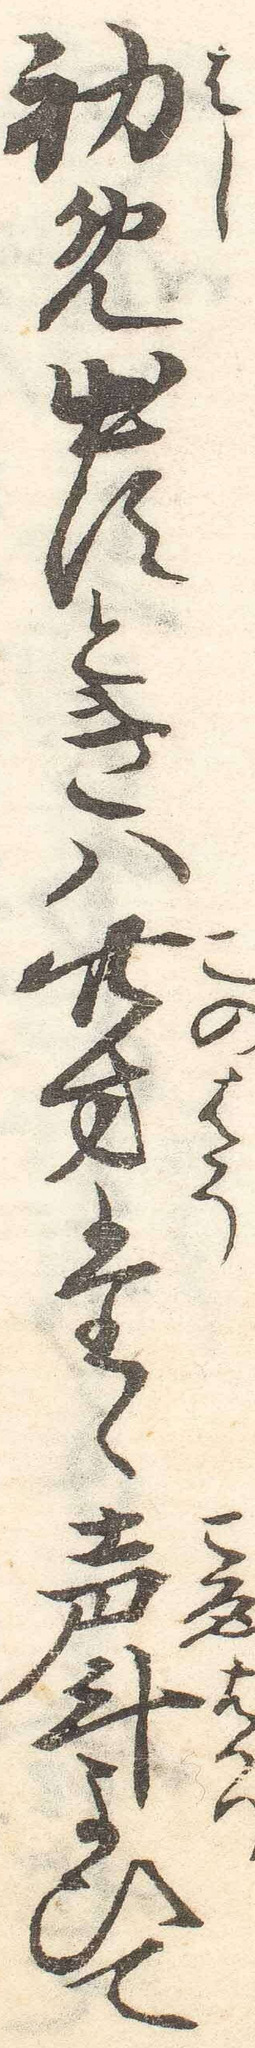初め出すときは此方たゝ声計よひて
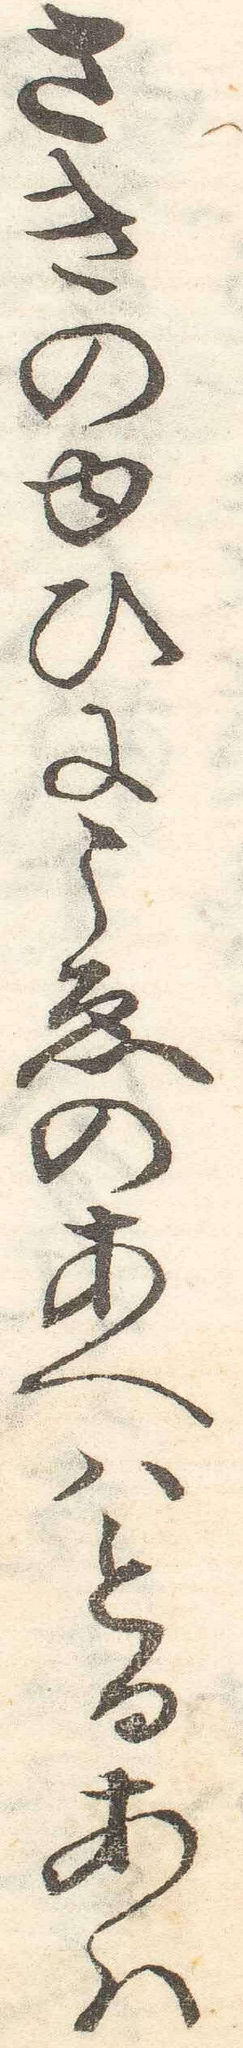さきのゆひにこゑのあへはとるあは
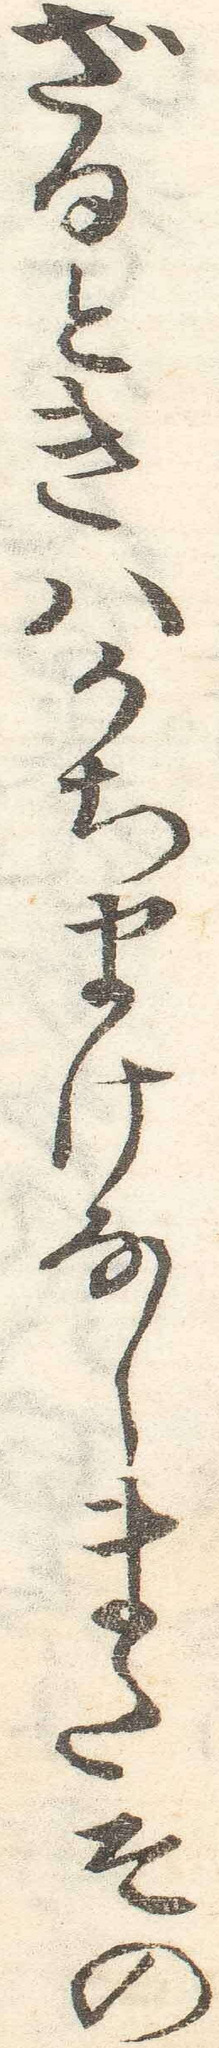ざるときはかちまけなしまたその
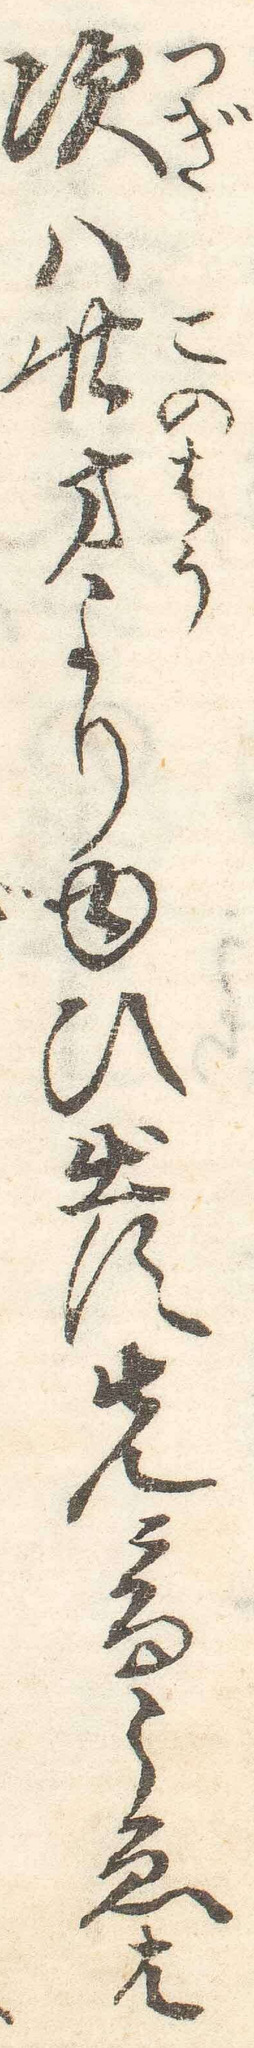次は此方よりゆひ出す先にてこゑは
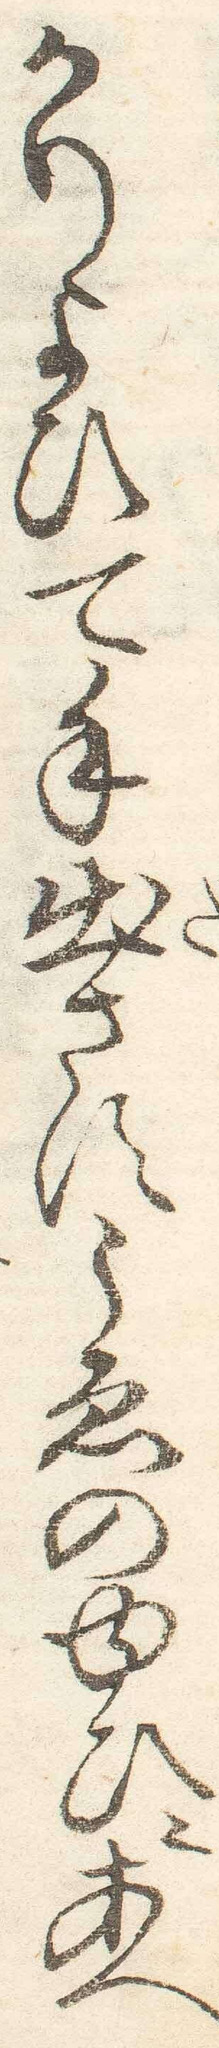かりよひて手出さすこゑのゆひにあへ
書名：拳独稽古
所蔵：東京学芸大学附属図書館 国文学研究資料館
